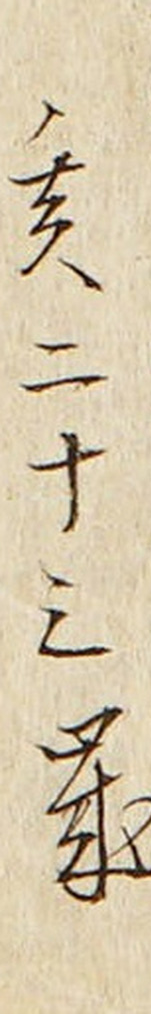亥二十三歳
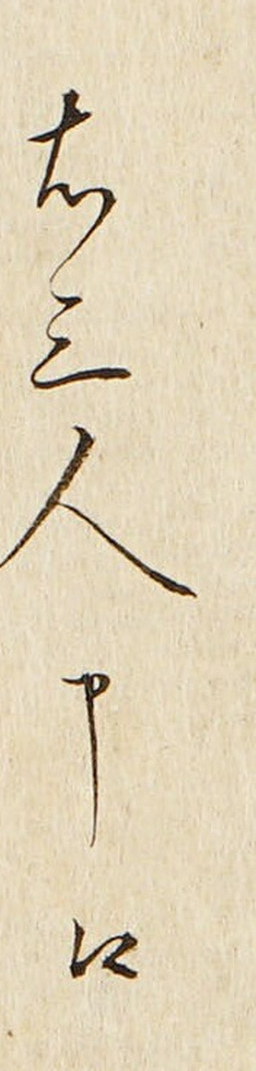右三人申口
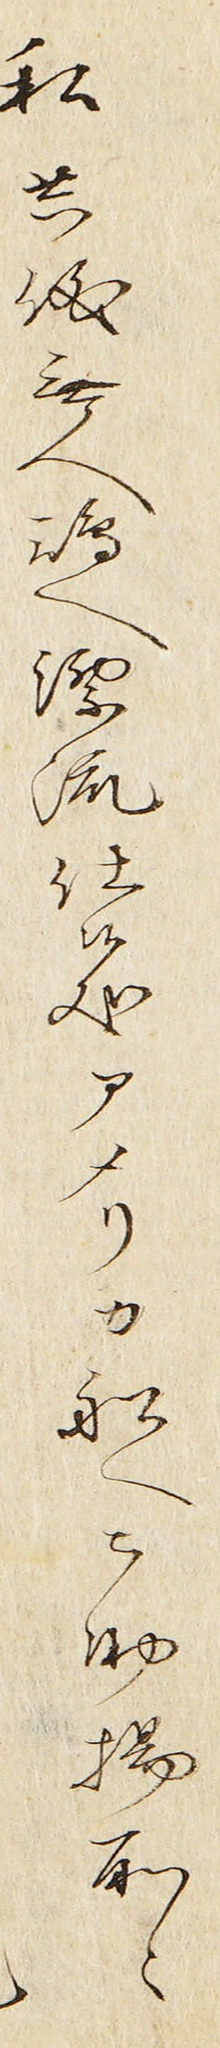私共儀無人嶋へ漂流仕候処アメリカ船へ被助揚所々
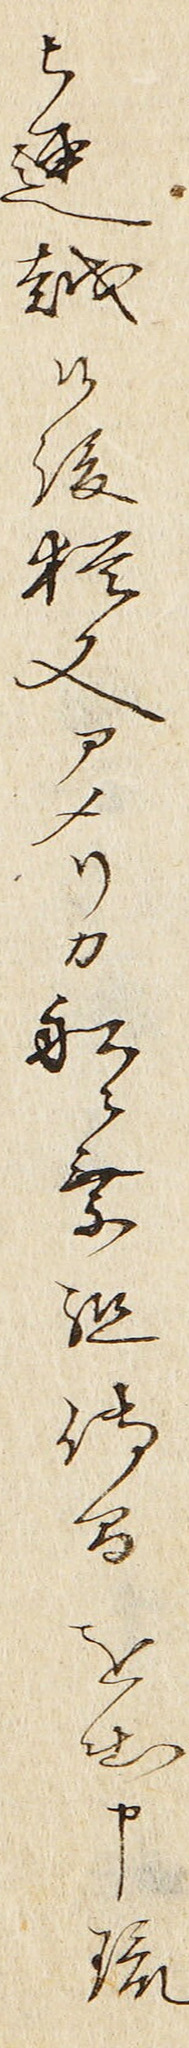被連越候後猶又アメリカ船に乗組伝間を出申琉
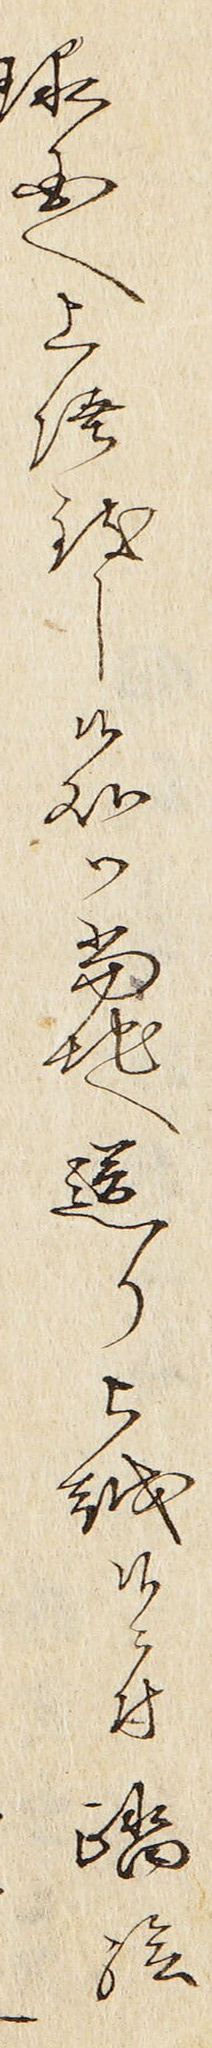球国へ上陸致し候処御当地へ送り被越候に付踏絵
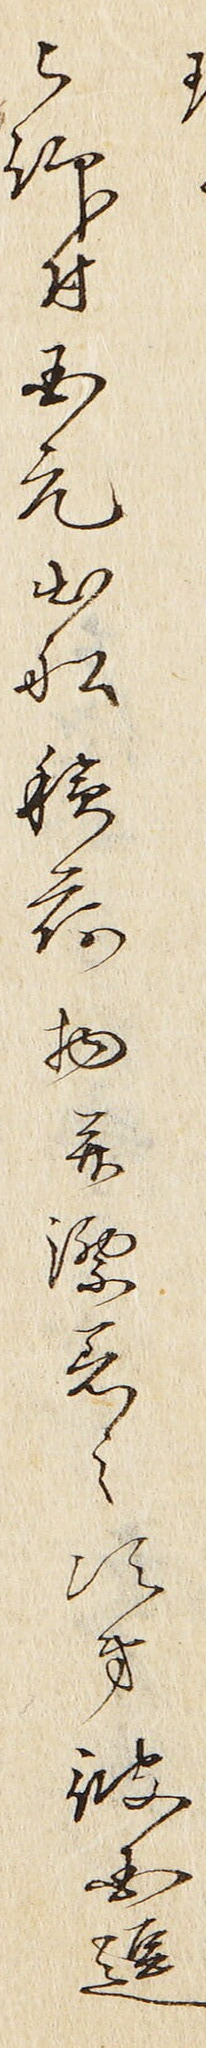被仰付国元出船積荷物并漂着之次第彼国逗
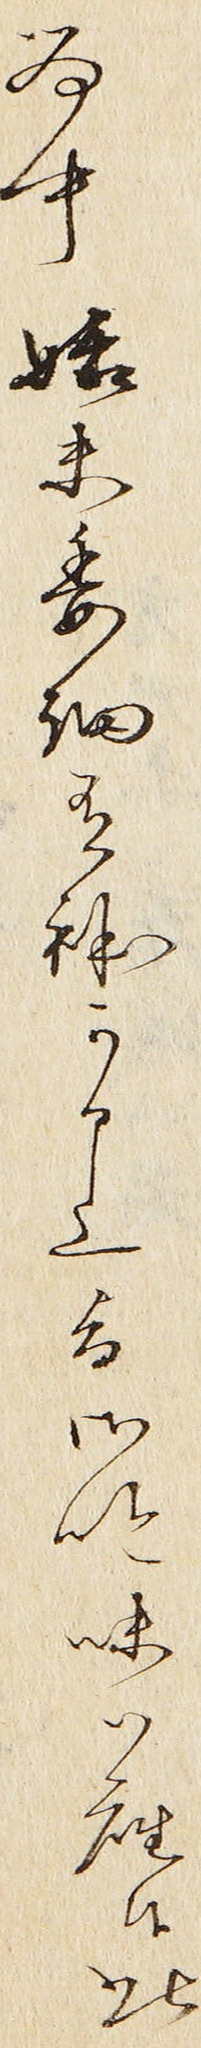留中始末委細有躰可申上旨御吟味御座候此
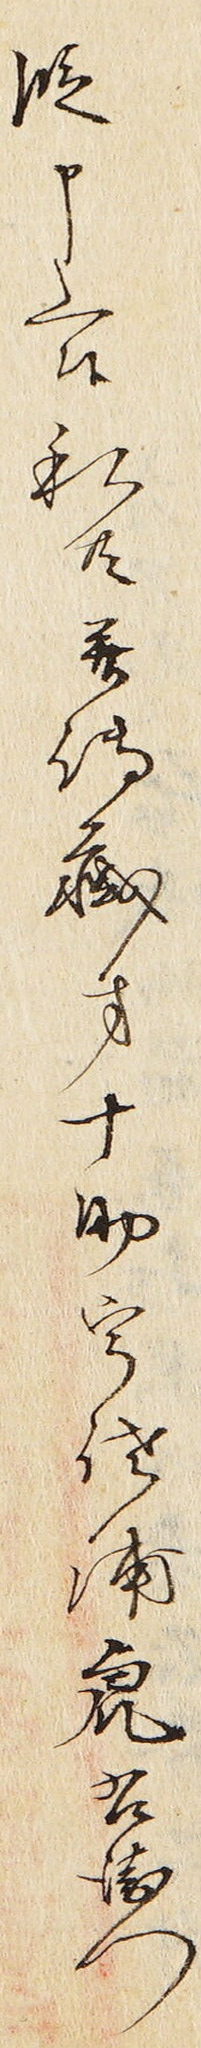段申上候私共并伝蔵弟十助宇佐浦虎右衛門
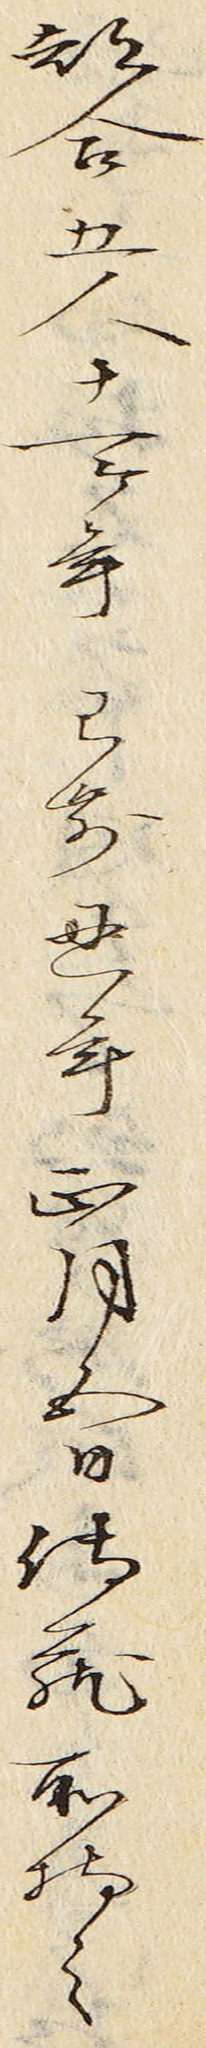都合五人十一ヶ年已前丑年正月五日伝蔵所持之
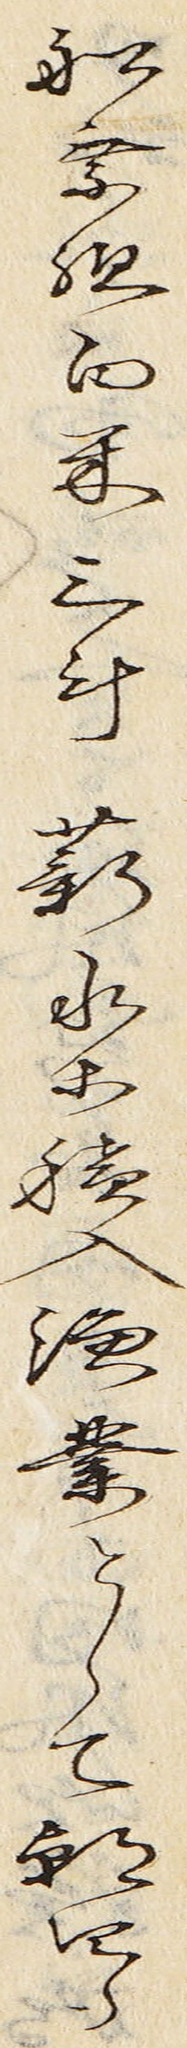船乗組白米三斗薪水等積入漁業として朝四ッ
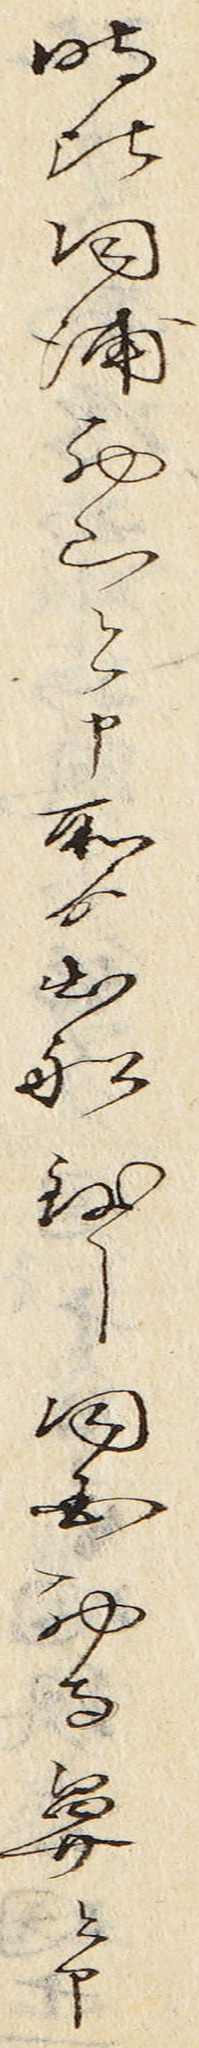時比同浦西山と申所ゟ出船致し同国西寺鼻と申
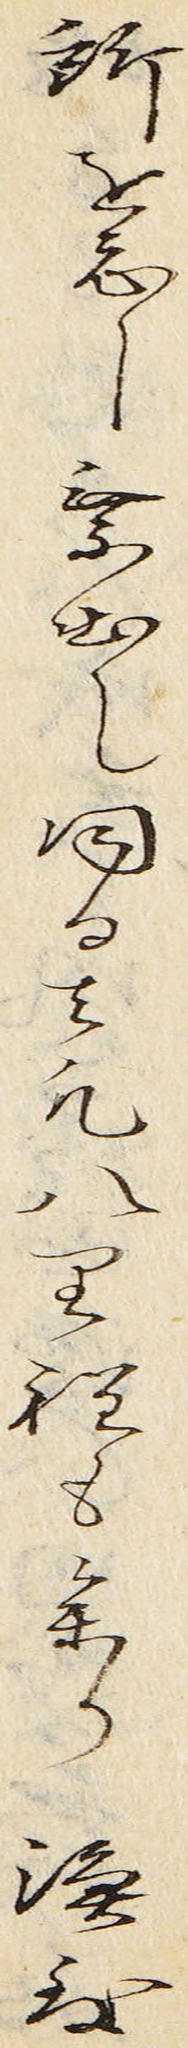所を志し乗出し同日は凡八里程も参り漁致
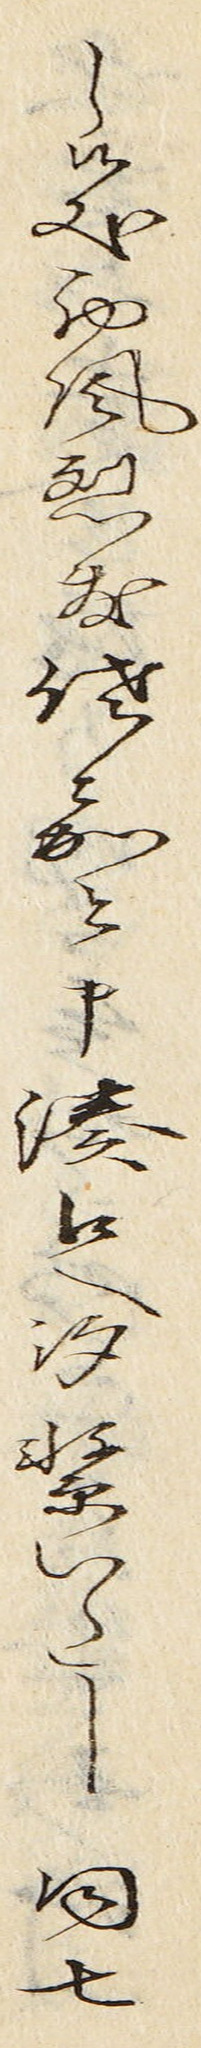し候処西風烈敷佐嘉と申湊口へ汐繋いたし同七
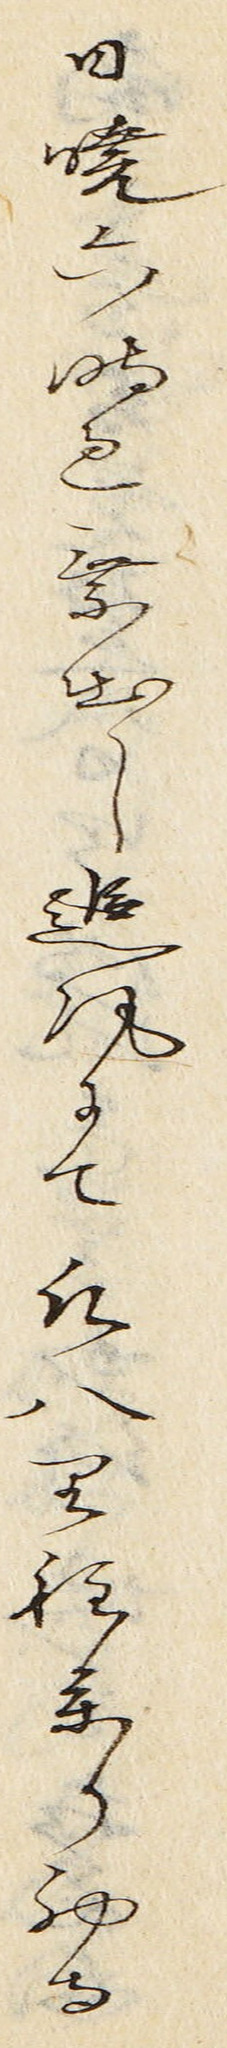日暁六時過乗出し追風にて凡八里程参り西寺
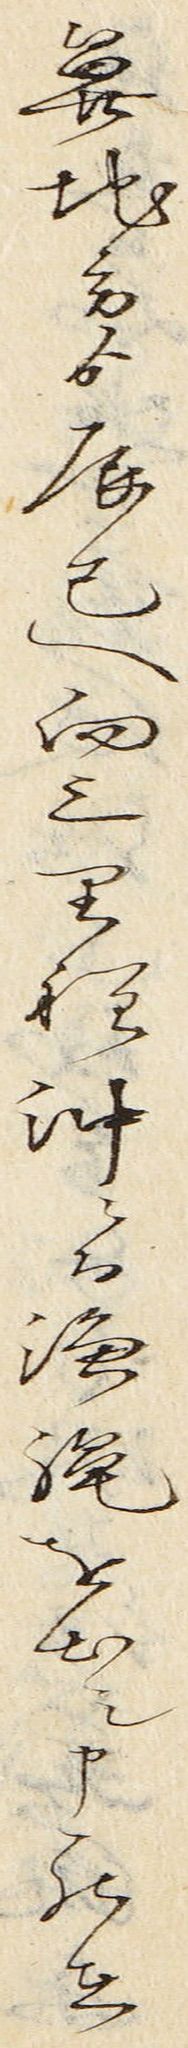鼻地方ゟ辰巳へ向三里程沖に而漁縄を出し申罷在
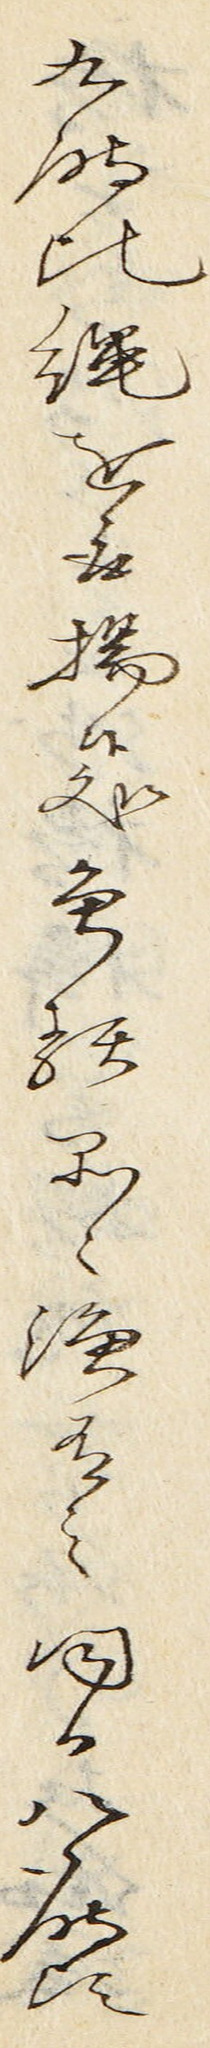九時比縄を取揚候処魚類品々漁有之同日八ッ時頃
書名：土佐中浜万次郎漂流記
